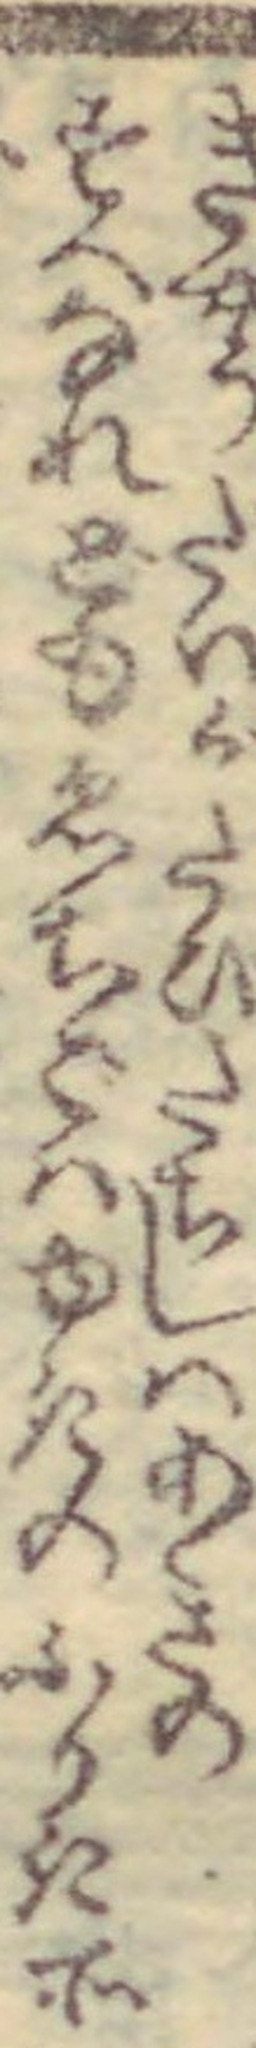すへなれどもゑちごはゆきのふりき所
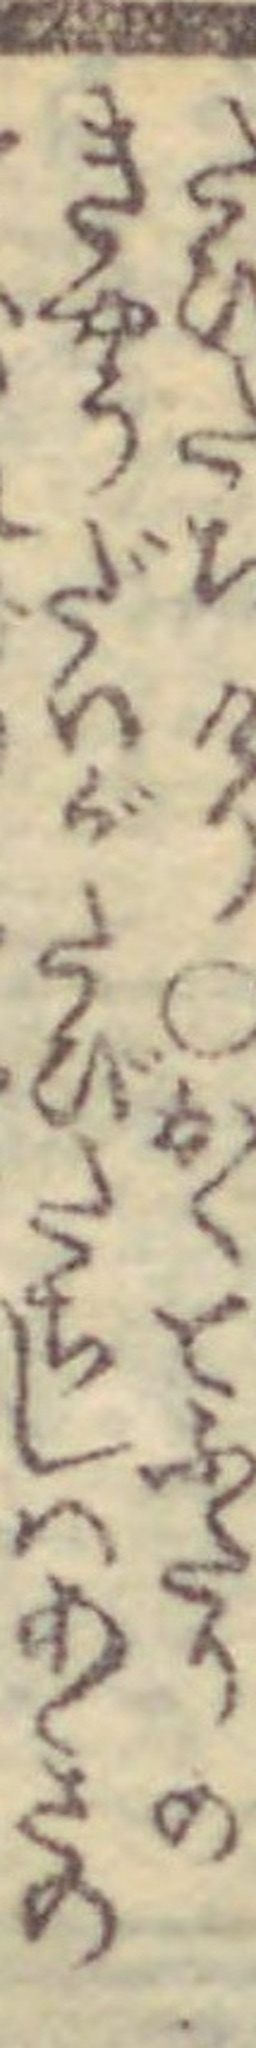きやうだいがたびたちしはあきの
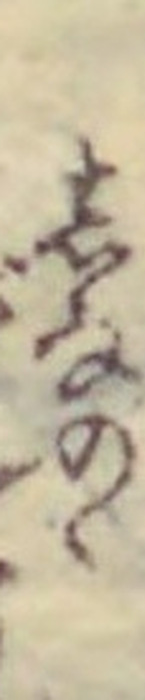しなのゝ
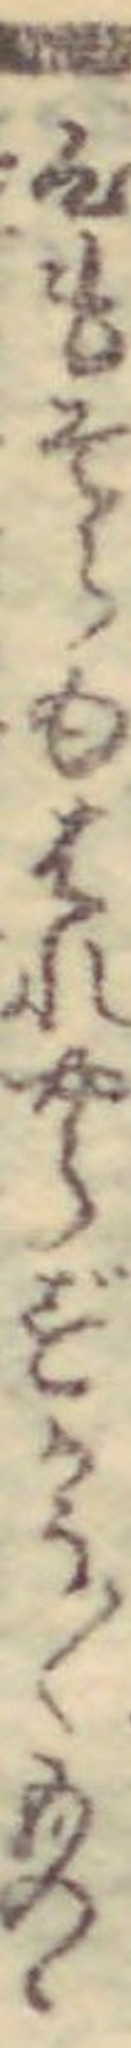心もそらもはれやらずかう〳〵ものゝ
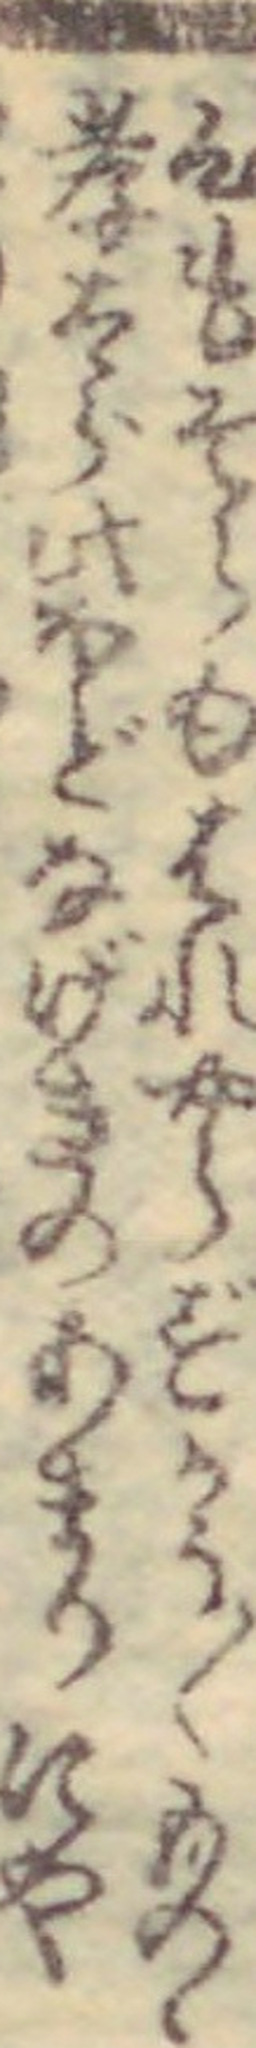孝太郎此ほどなげきのあまりにや
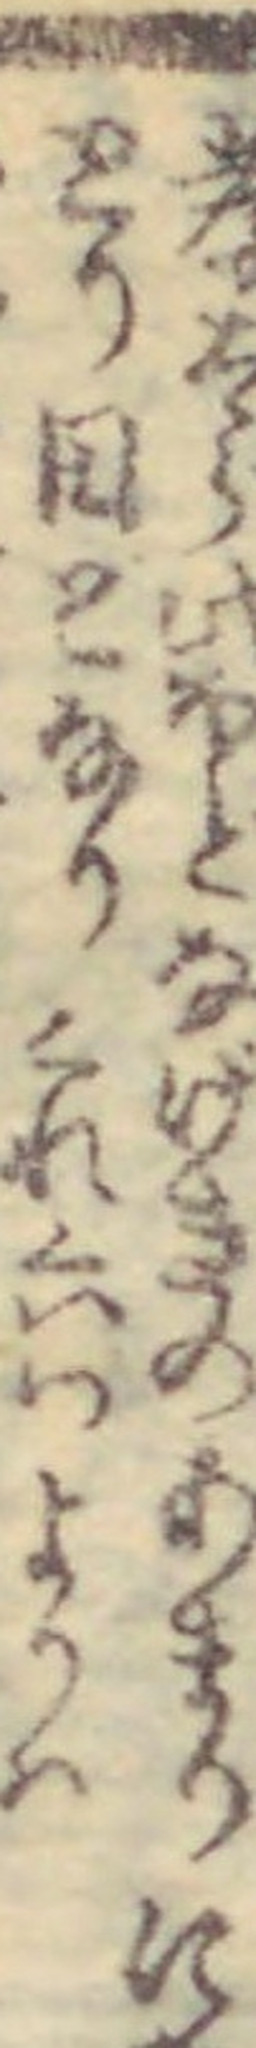とり目となりくれ六つよりは
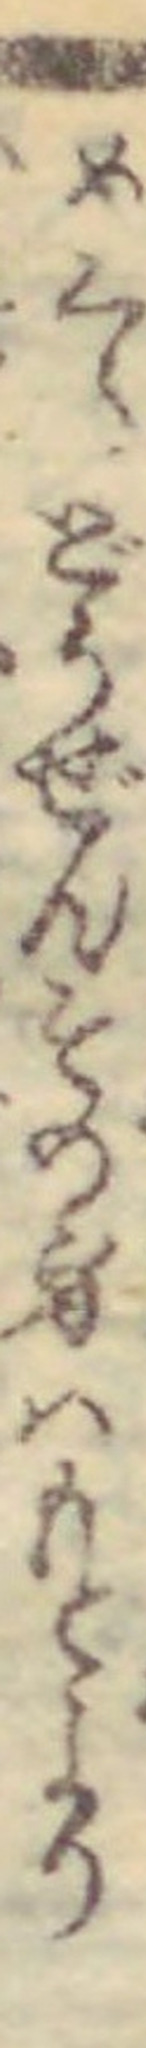めくらどうぜんその身はもとより
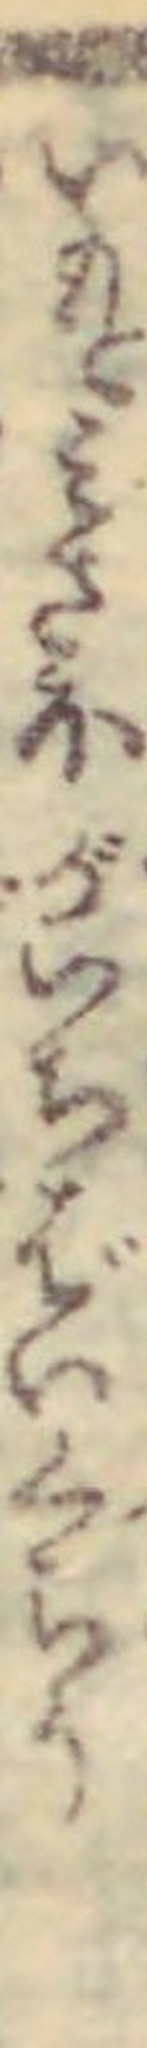いもとみさほがいちばいくらう
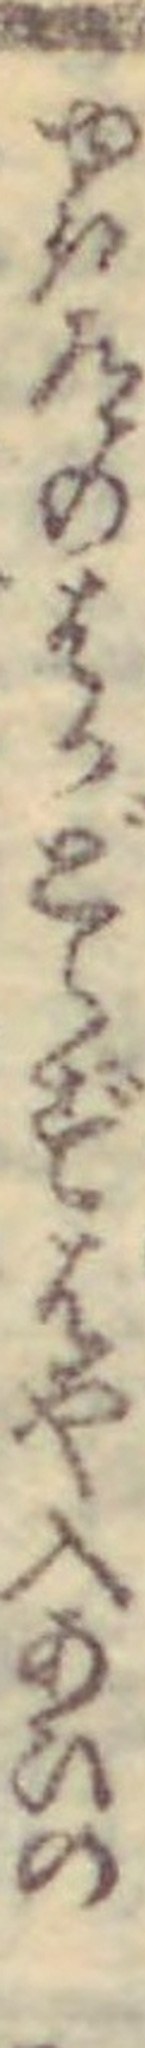ゆき道のはかどらずはや入あひの
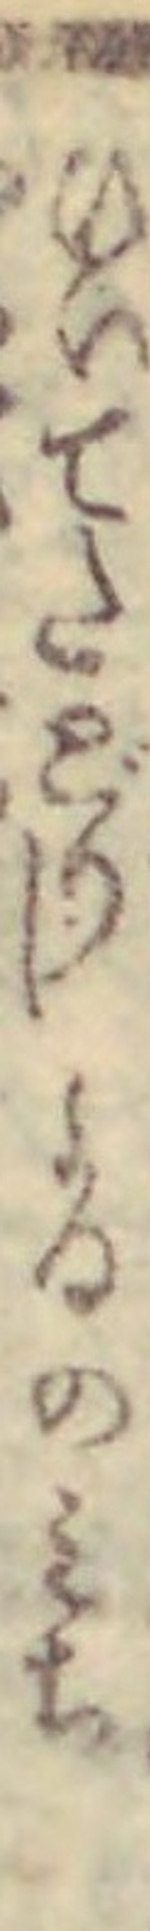ひいてたどりしよるのみち
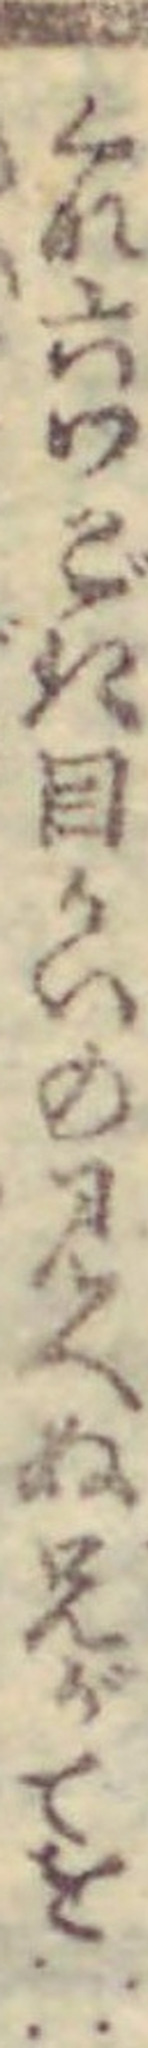くれ六つどき目かいの見へぬ兄がてを
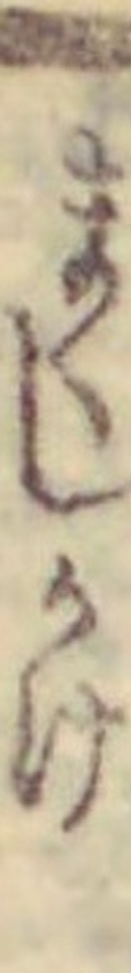まくしかけ
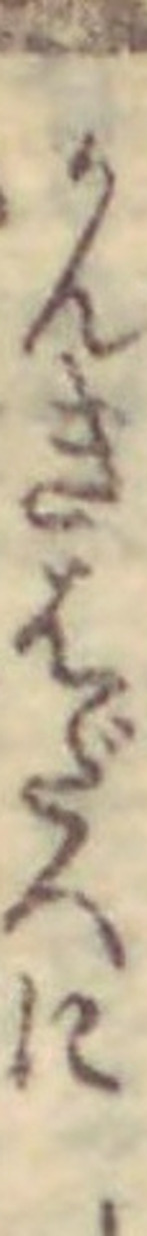かんきはだへに
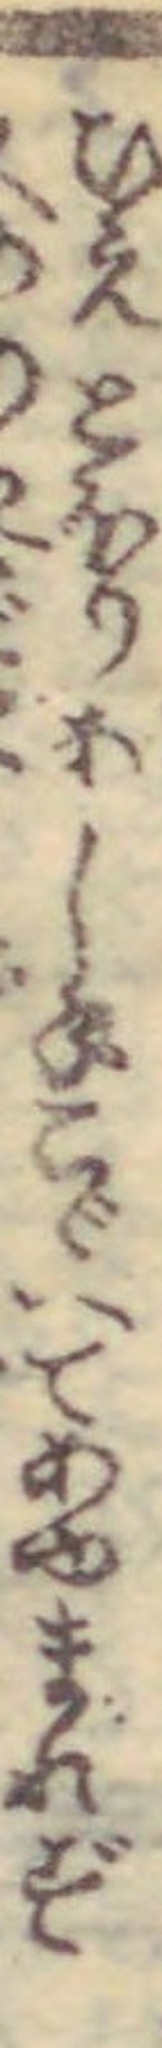ひえとほりあし手こゞへてあゆまれず
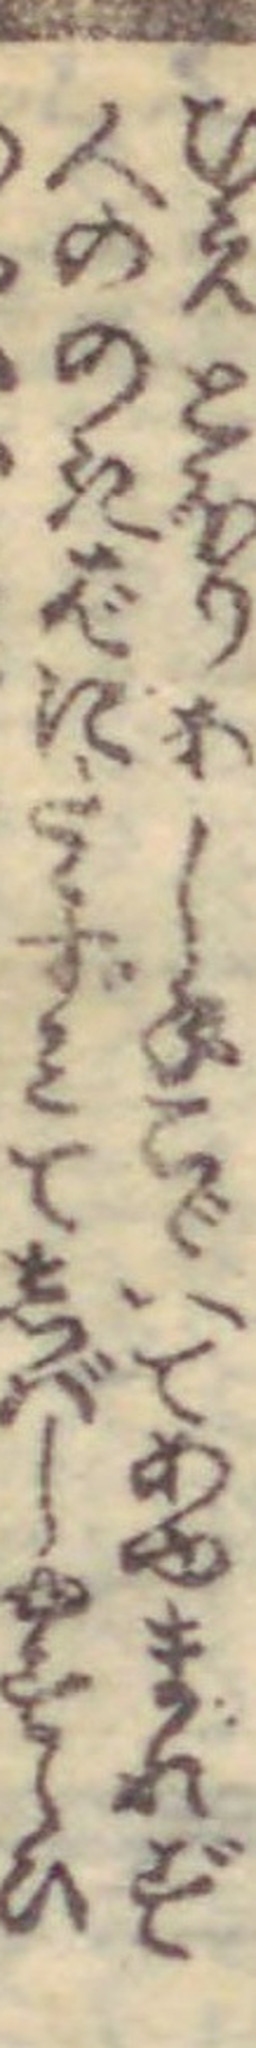人ののきばにたゝずみてしばしやすらひ
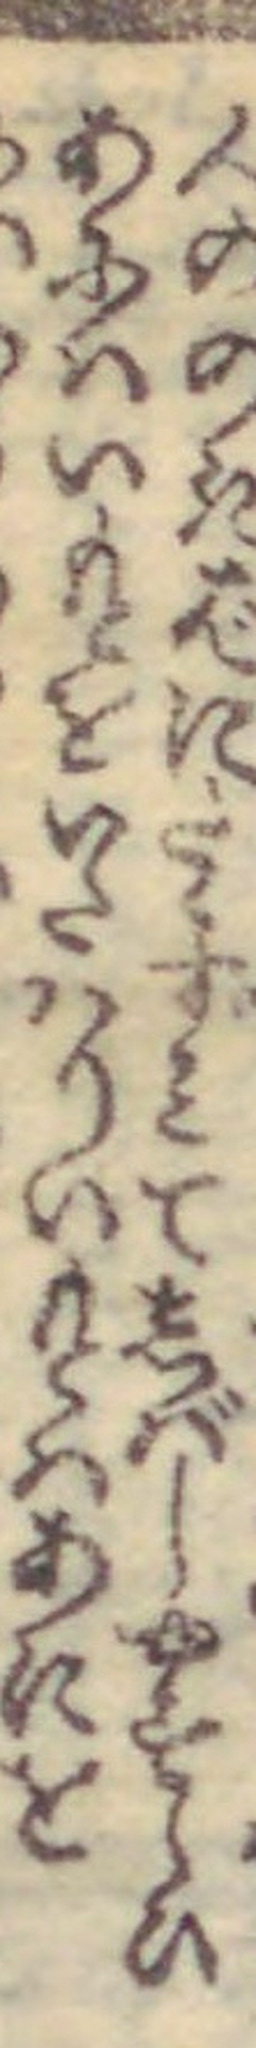あにはいもとをいたはりいもとはあにを
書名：八ツ目鱣因縁物語 3巻
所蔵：国立国会図書館 National Diet Library, JAPAN
